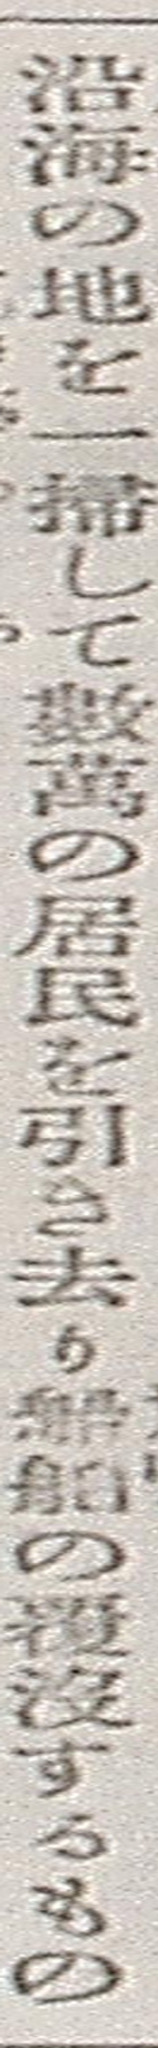沿海の地を一掃して数万の居民を引き去り船舶の覆没するもの
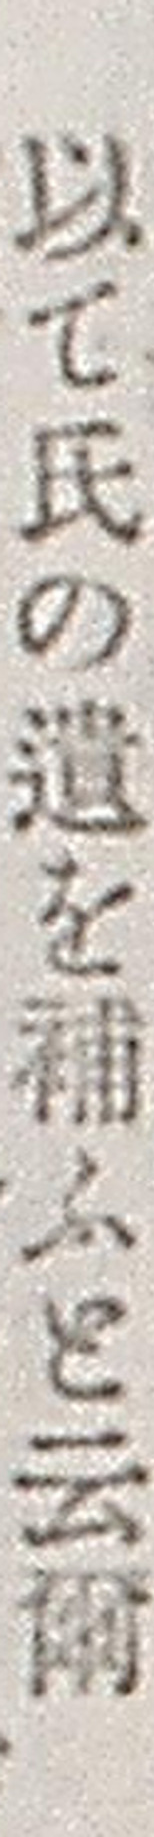以て氏の遺を補ふと云爾
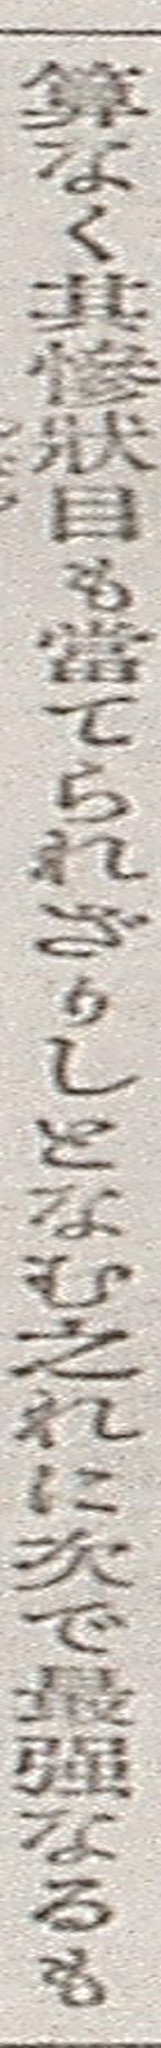算なく其惨状目も当てられざりしとなむ之れに次で最強なるも
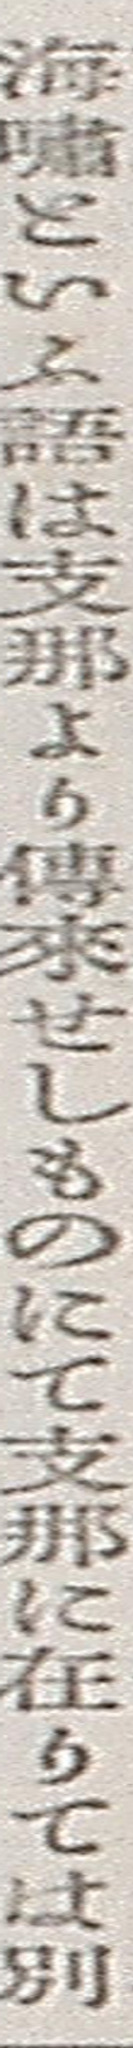海嘯といふ語は支那より伝来せしものにて支那に在りては別
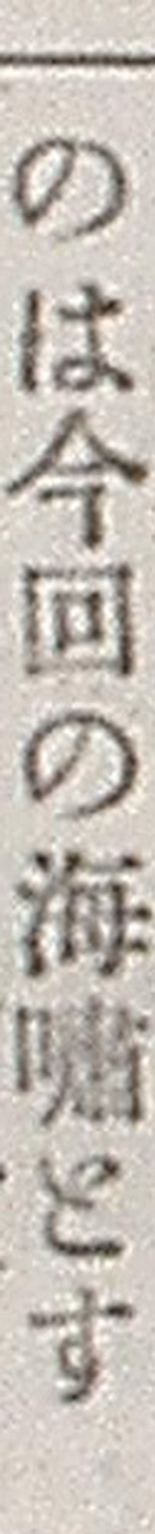のは今回の海嘯とす
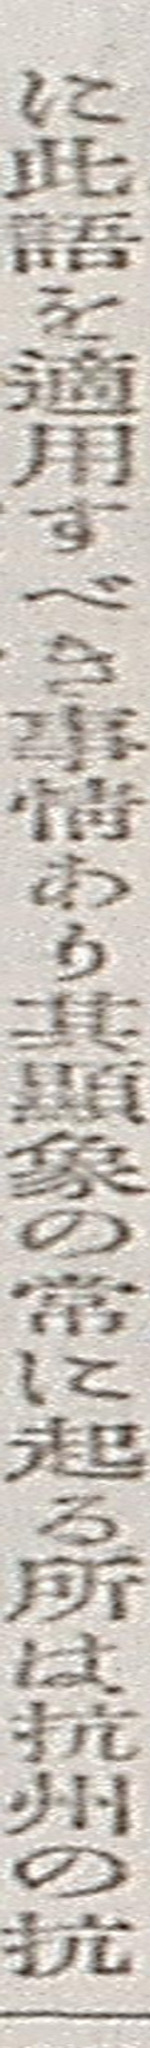に此語を適用すべき事情あり其顕象の常に起る所は杭州の杭
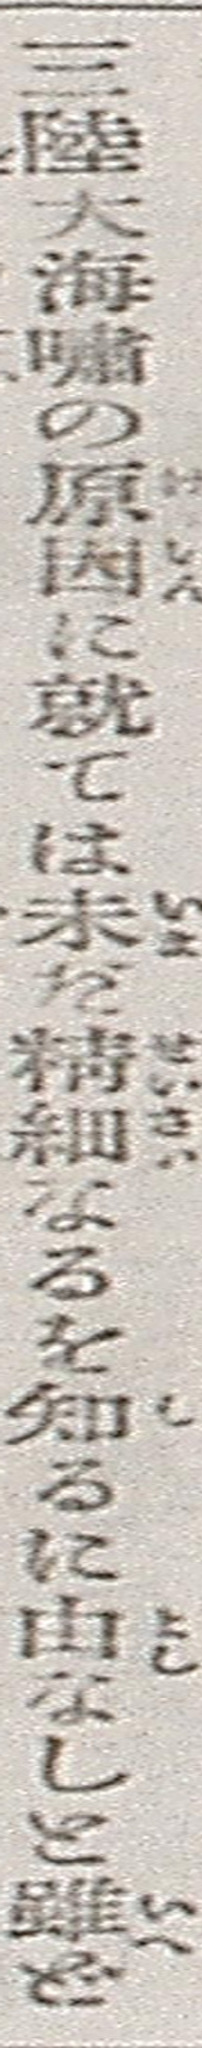三陸大海嘯の原因に就ては未だ精細なるを知るに由なしと雖ど
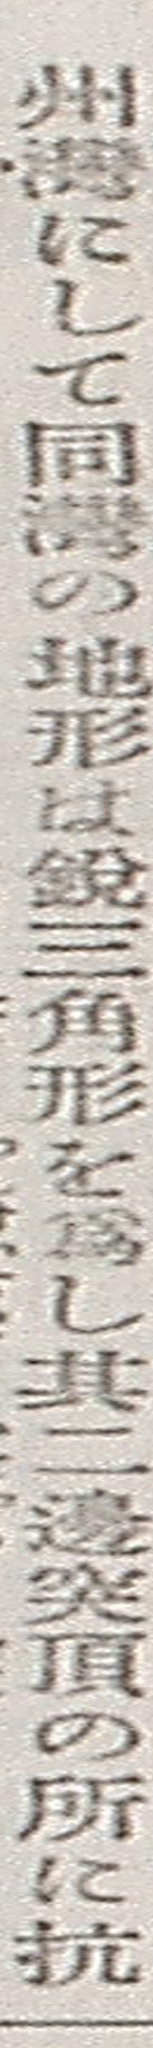州湾にして同湾地形は鋭三角形を為し其二辺突頂の所に杭
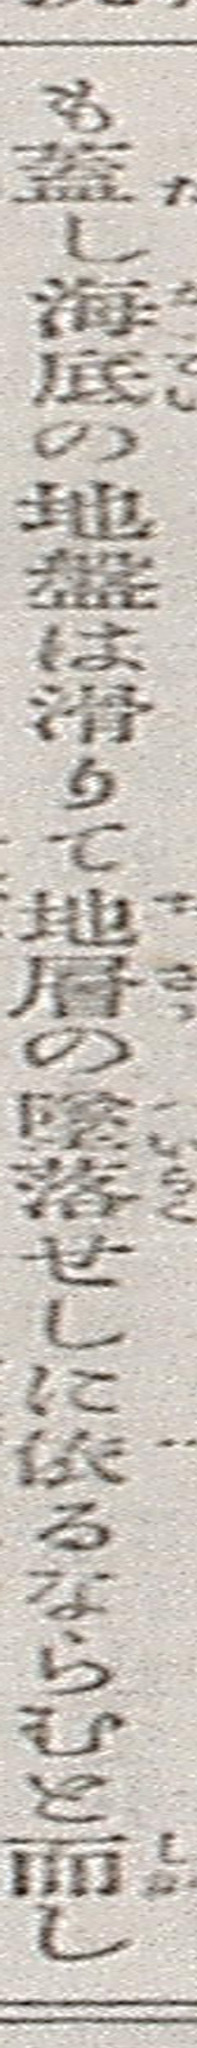も蓋し海底の地盤は滑りて地層の墜落せしに依るならむと而し
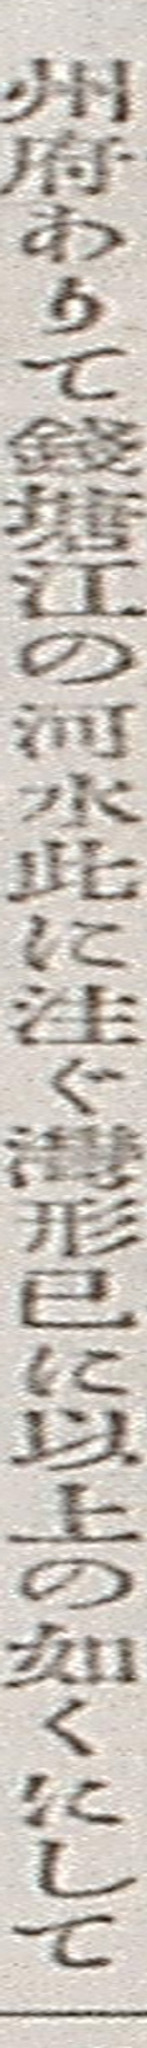州府ありて銭塘江の河水此に注ぐ湾形已に以上の如くにして
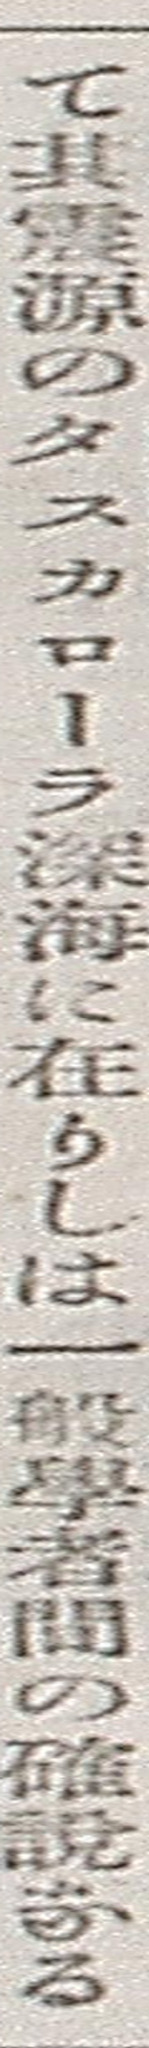て其震源のタスカローラ深海に在りしは一般学者間の確説なる
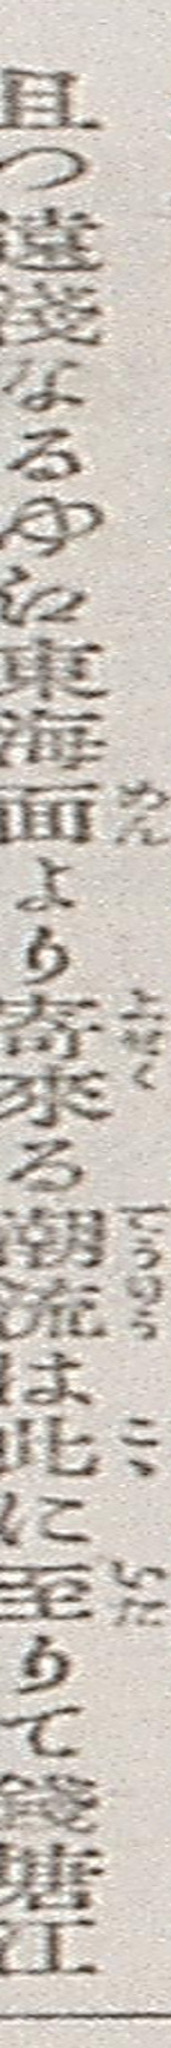且つ遠浅なるゆえ東海面より寄来る潮流は此に至りて銭塘江
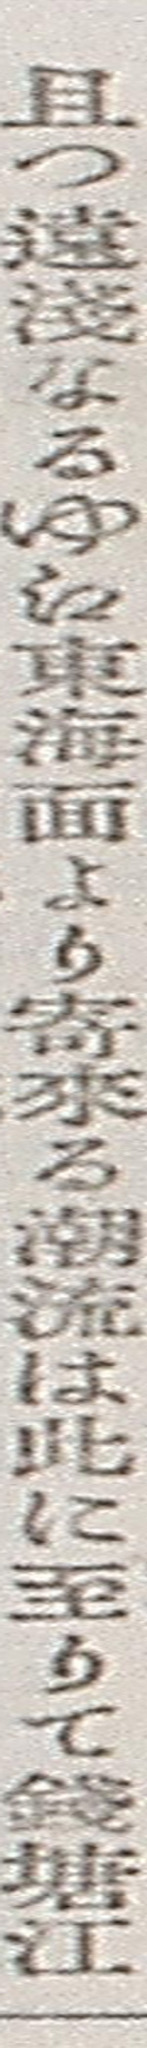且つ遠浅なるゆえ東海面より寄来る潮流は此に至りて銭塘江
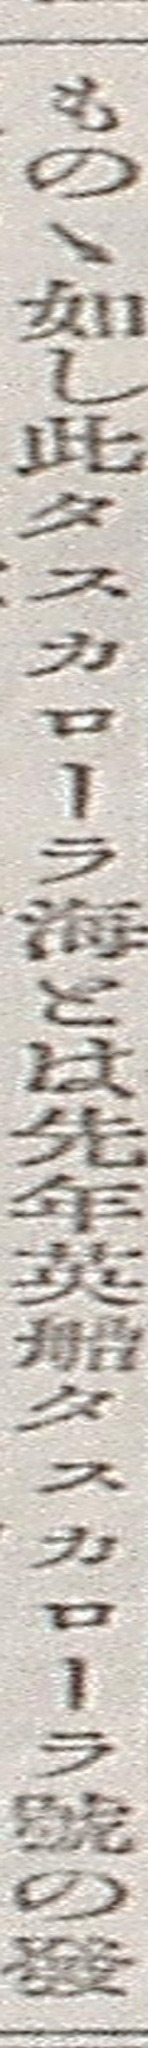ものゝ如し此タスカローラ海とは先年英船タスカローラ号の発
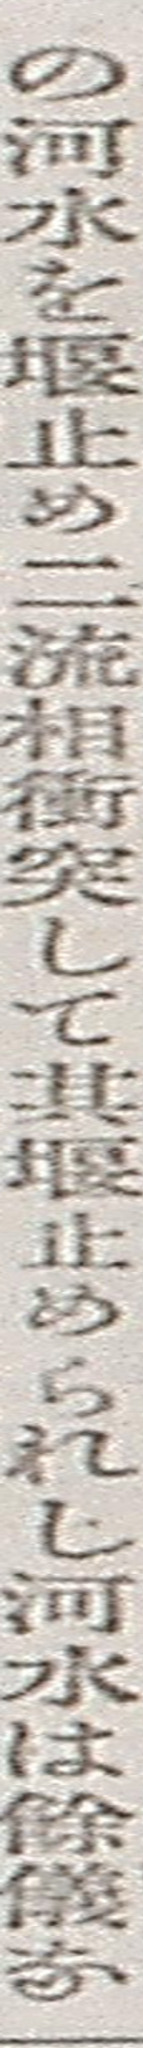河水を堰止め二流相衝突して其堰止められし河水は余儀な
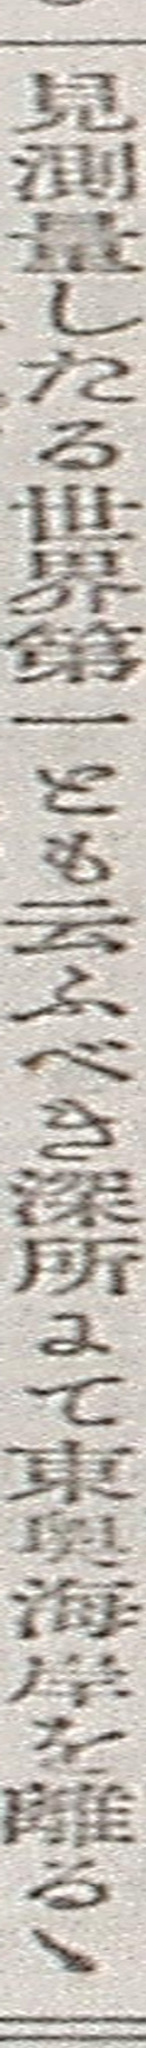見測量したる世界第一とも云ふべき深所にて東奥海岸を離るゝ
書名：風俗畫報臨時増刊第百二十號　大海嘯被害録（下）
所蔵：東京大学地震研究所図書室 Earthquake Research Institute Library, The University of Tokyo, JAPAN
